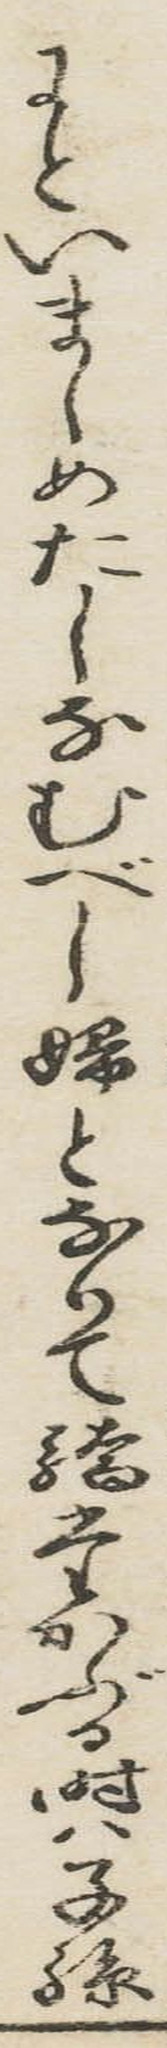にといましめたしなむべし婦となりて驕りたかぶる時は子孫
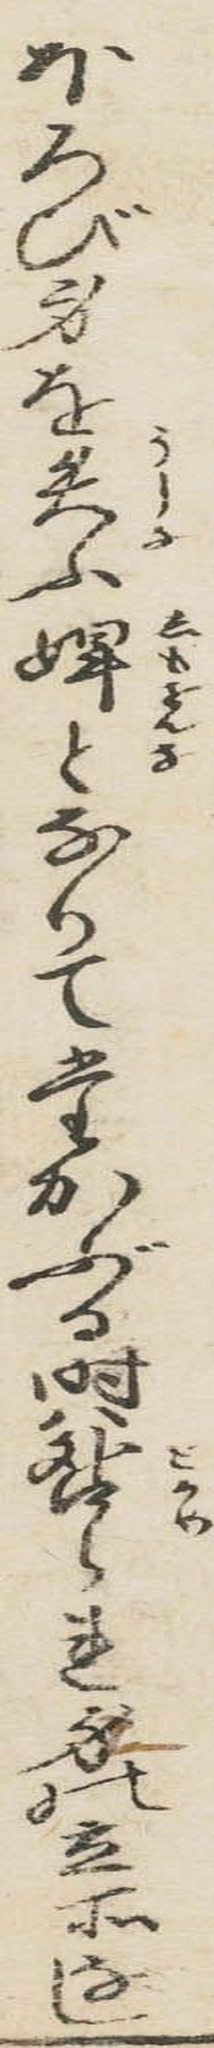ほろび身を失ふ婢となりてたかぶる時は咎られ身の立所なし
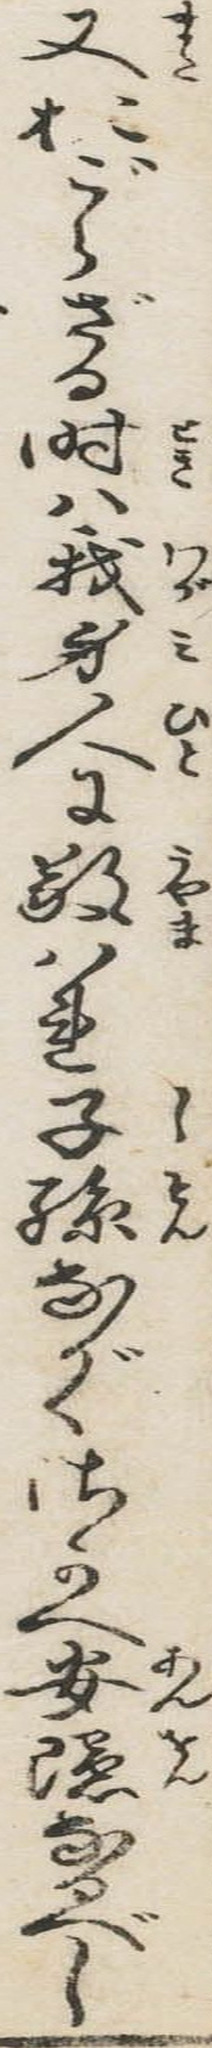又おごらざる時は我身人に敬はれ子孫ながくさかへ安穏なるべし
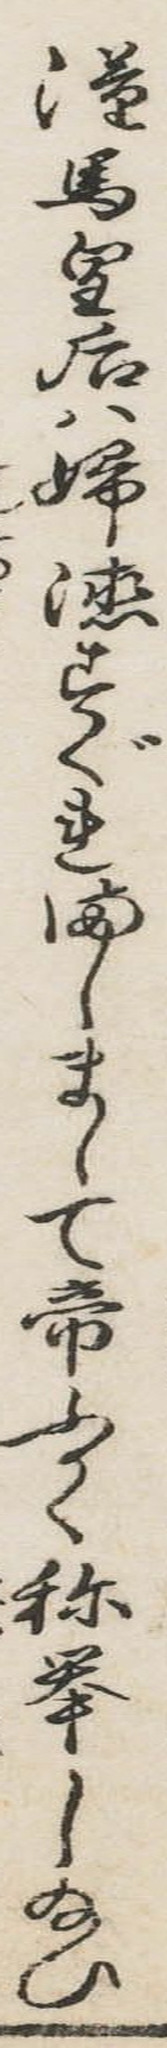漢馬皇后は婦徳すぐれましまして帝ふかく称挙し給ひ
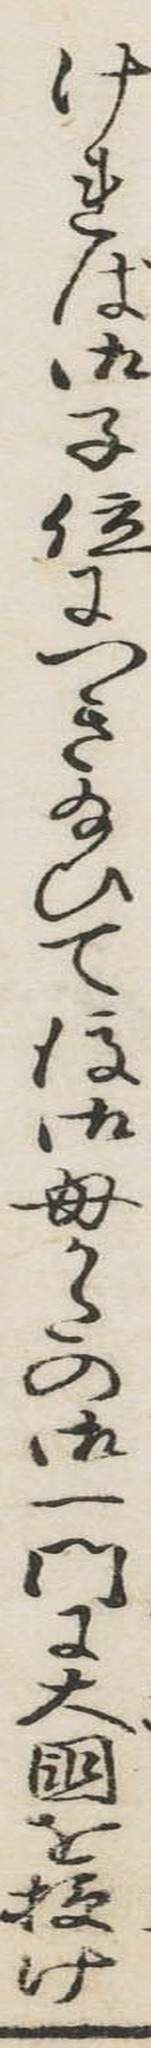ければ御子位につき給ひて後御母かたの御一門に大国を授け
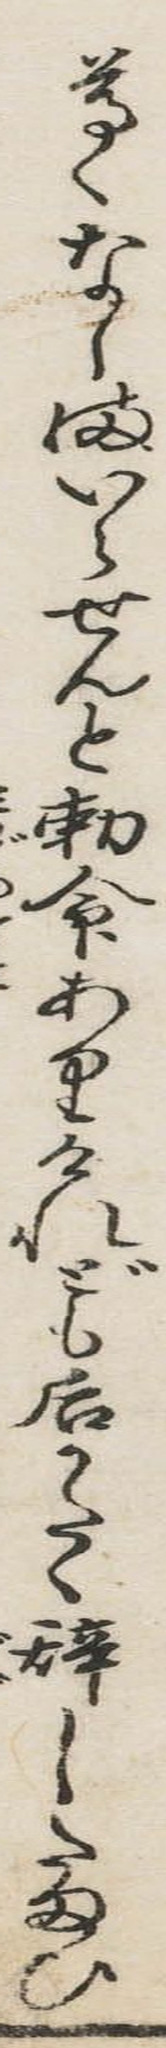尊くなしまいらせんと勅命ありけれど后かたく辞したまひ
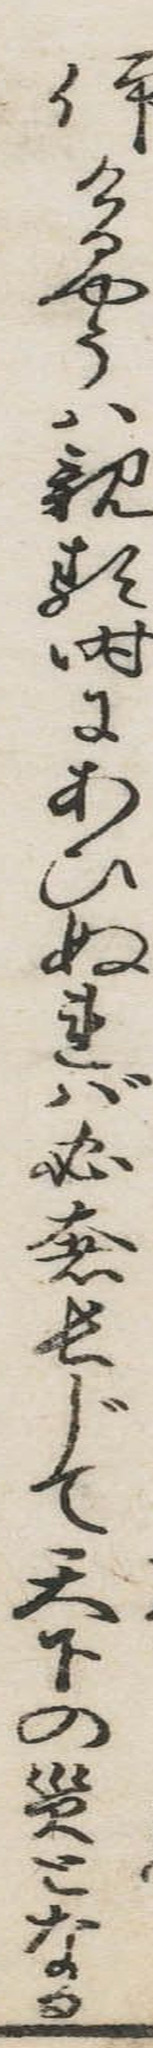仰けるやうは親類時にあひぬれば必奢長じて天下の災となる
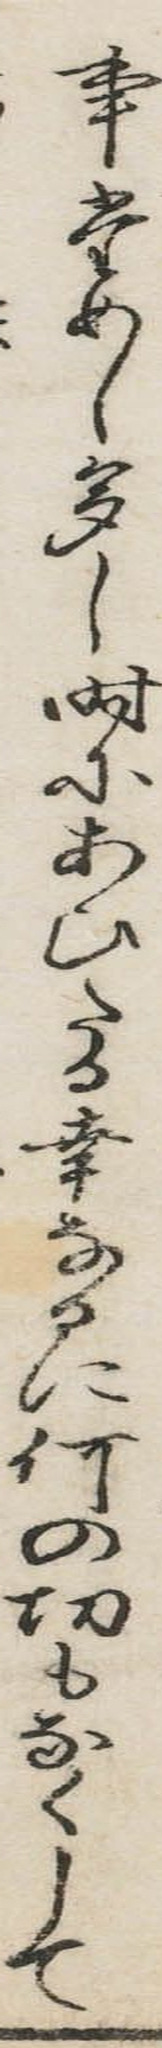事ためし多し時にあひたる幸なるに何の功もなくして
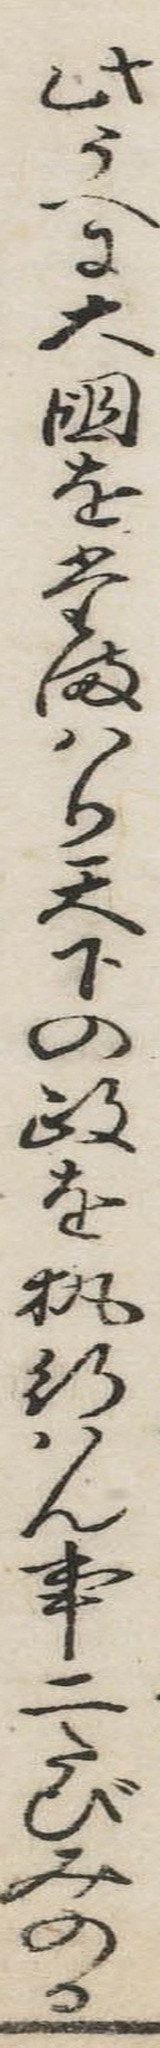此うへに大国をたまはり天下の政を執行はん事二たびみのる
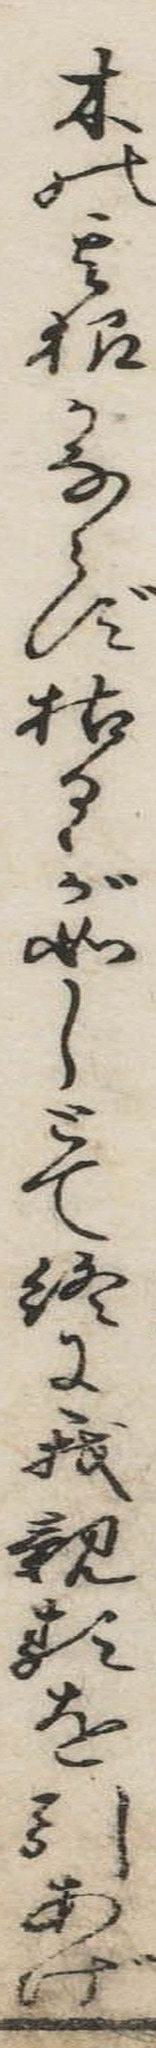木の其根かならず枯るゝが如しとて終に我親類を引あげ
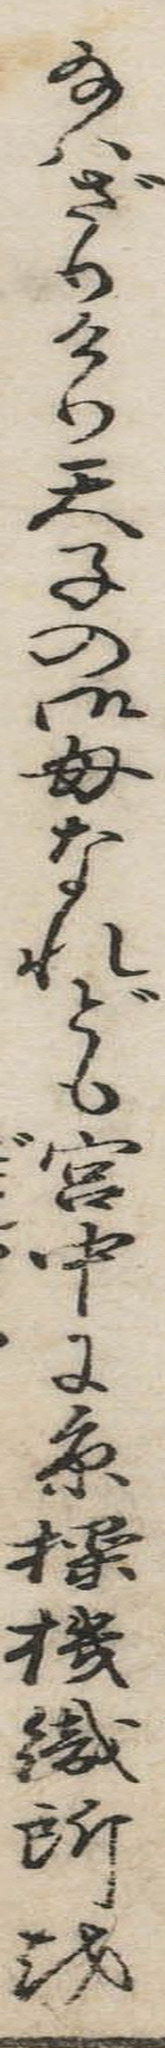給はざりけり天子の御母なれども宮中に糸繰機織所を
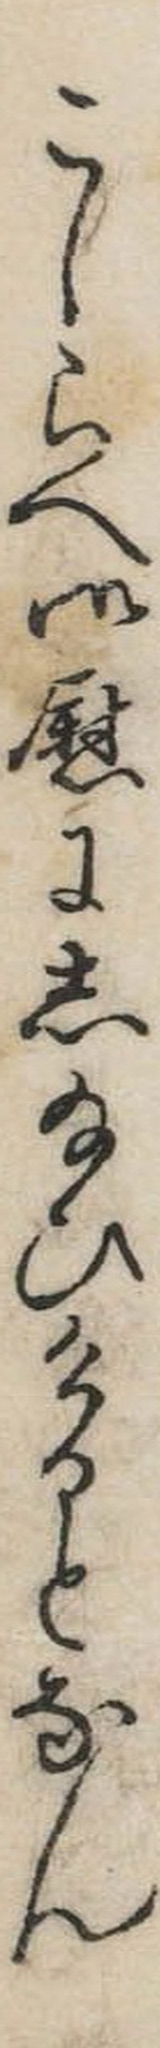こしらへ御慰にし給ひけるとなん

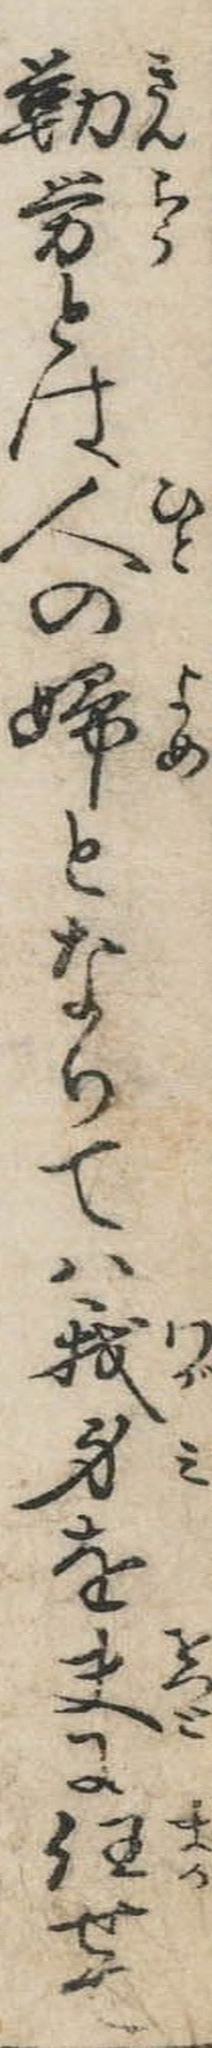勤労勤労とは人の婦となりては我身を夫に任せて
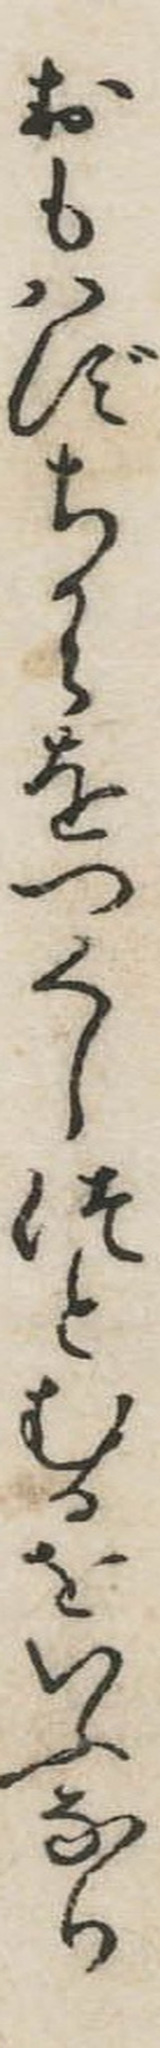おもはずちからをつくしつとむるをうふなり
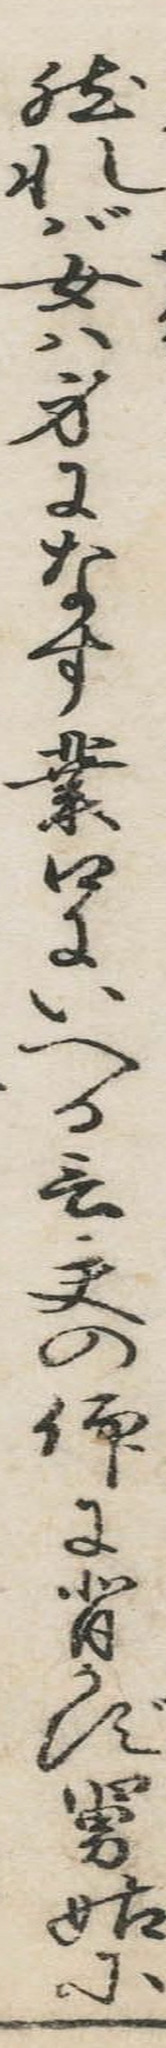然れば女に身になす業口にいへる言夫の仰に背かず舅姑に
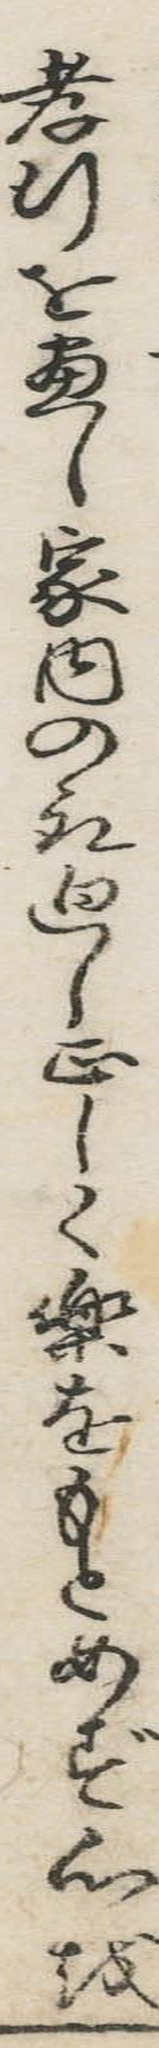孝行を尽し家内の取廻し正しく楽をもとめず心を
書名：前訓
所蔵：東京学芸大学附属図書館
